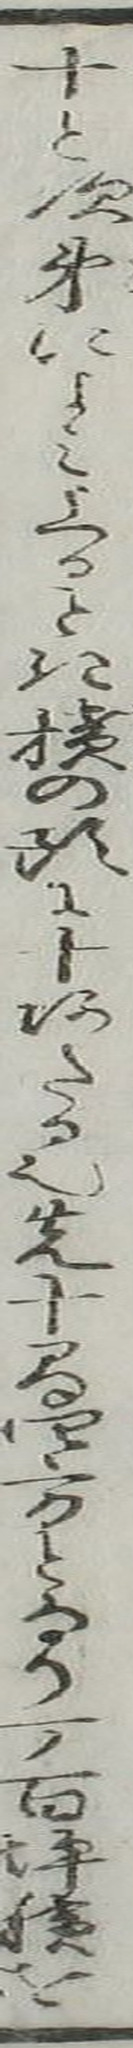十と次第によみ上るとき積の頭に十あたる也先十間四方となり一ノ百坪積を
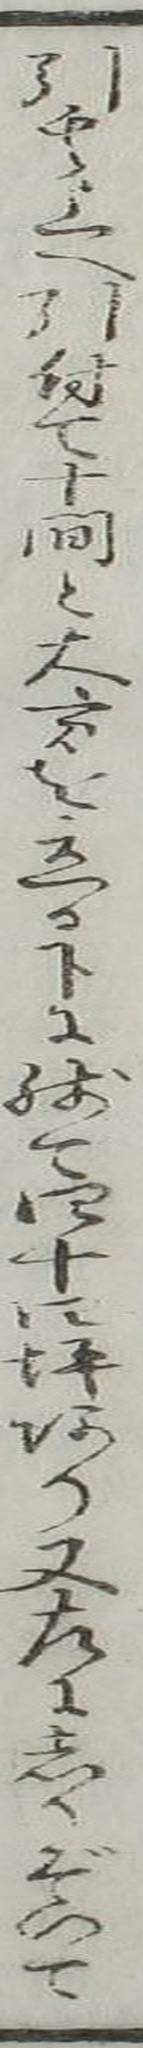引其上へ引付て十間と大方を立る下に残て四十四坪あり又左にしりぞいて
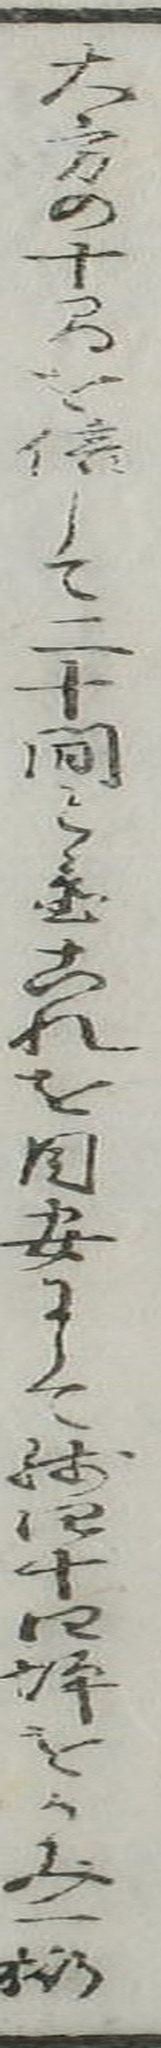大方の十間を倍して二十間と置これを目安にして残四十四坪をかみ一桁
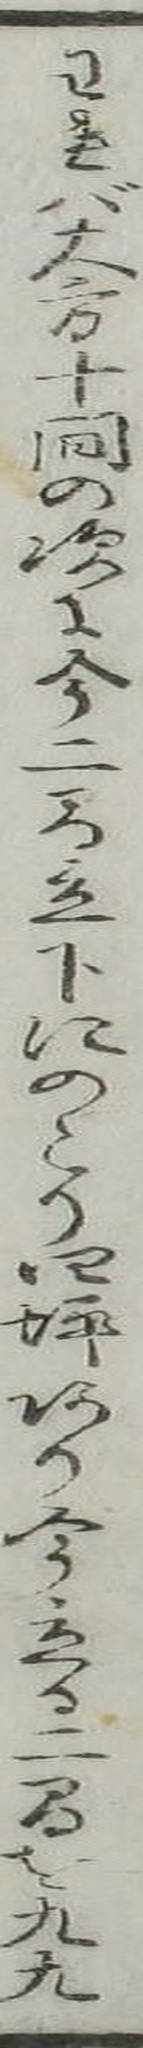われば大方十間の次に今二間立下にのこり四坪あり今立る二間を九九
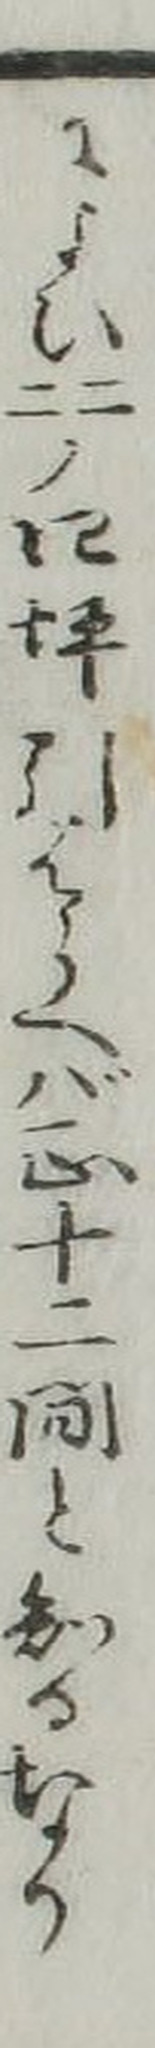によひ二二ノ四坪引はらへば正十二間と知るなり

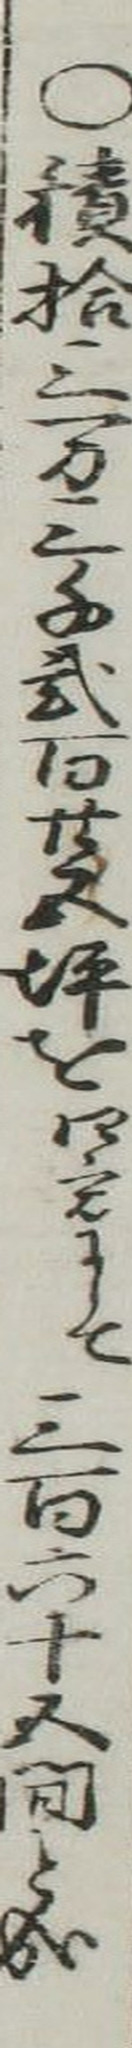○積拾三万三千弐百廿五坪を四定にして三百六十五間と成
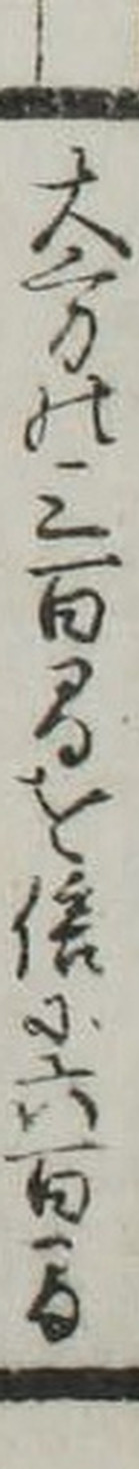◆坪大方の三百間を倍に六百間
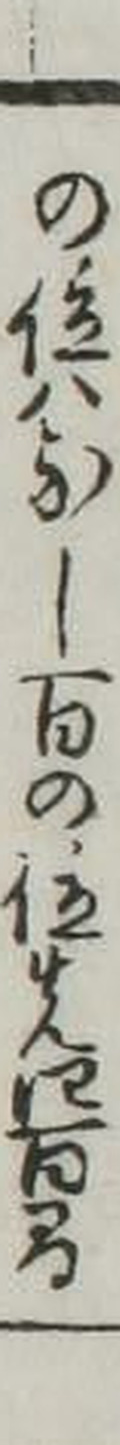十◆◆の位はなし百の位先四百間
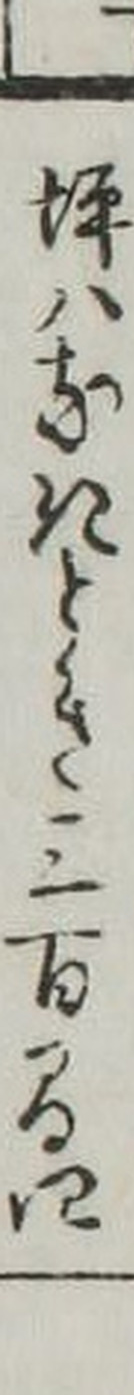十坪はなきとき三百間四
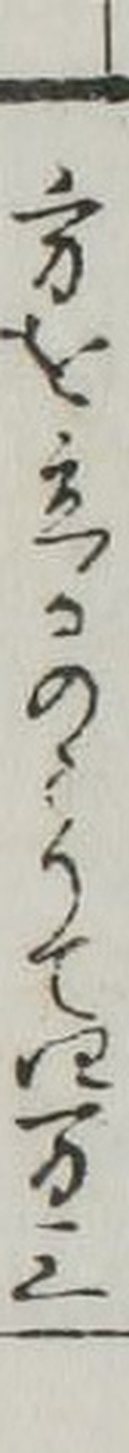百方を立るのこりて四万三
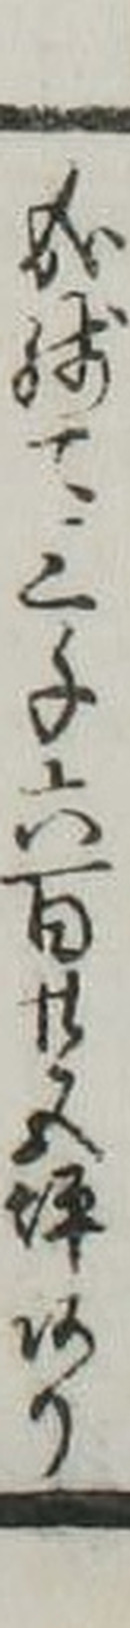成残て三千六百廿五坪あり
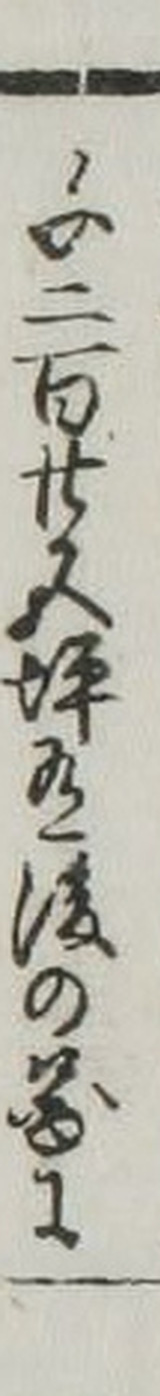積十◆千二百廿五坪有後の図に
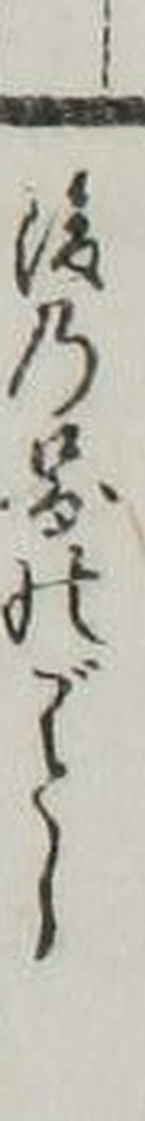後の図のごとし
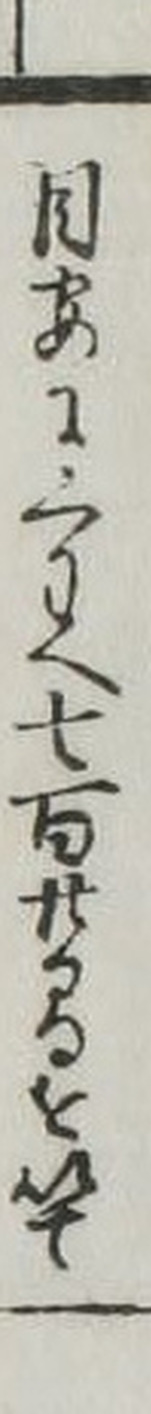◆百◆目安にくわへ七百廿間を以て
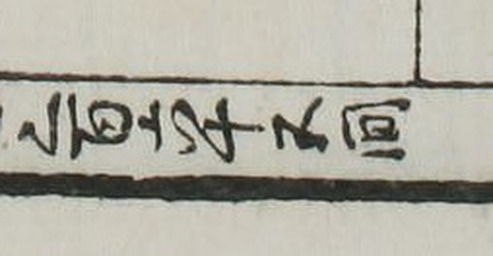三百六十五間
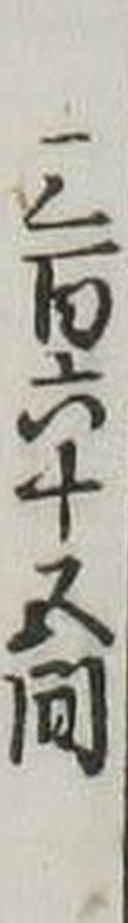三百六十五間
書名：宝玉塵劫記
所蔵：東京学芸大学教育コンテンツアーカイブ
